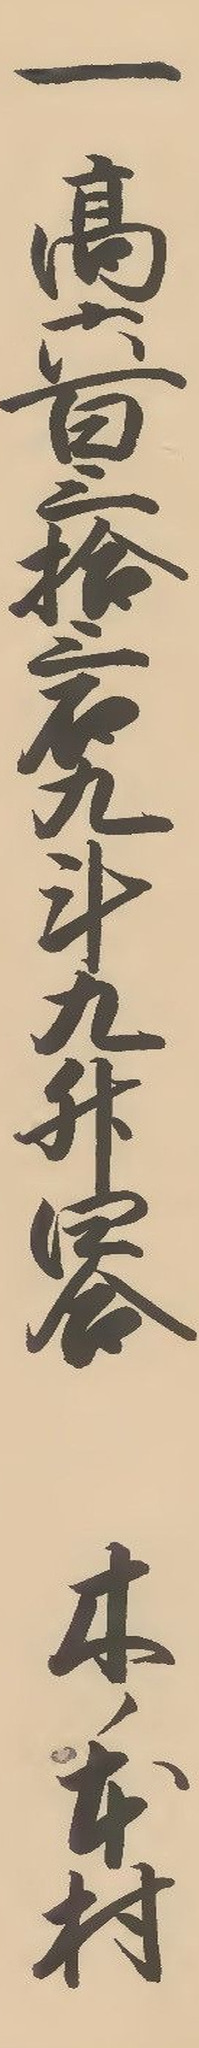一高六百三拾三石九斗九升四合木ノ本村
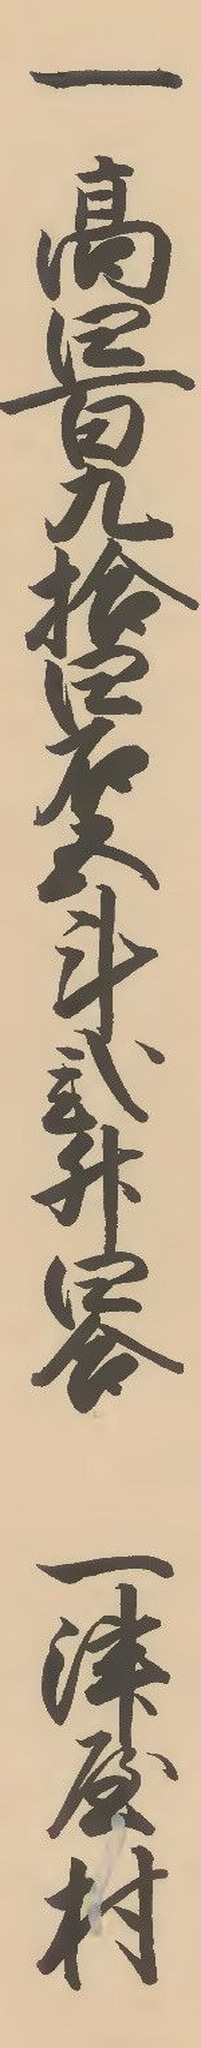一高四百九拾四石五斗弐升四合一津屋村
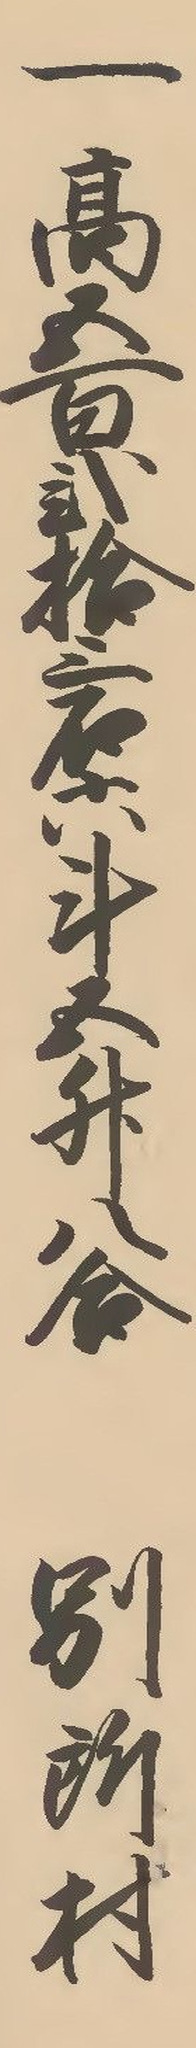一高五百弐拾三石六斗五升八合別所村
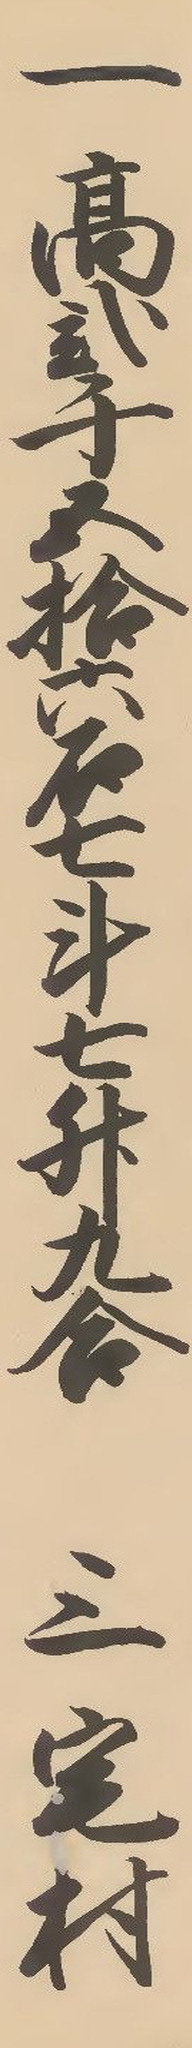一高弐千五拾六石七斗七升九合三宅村
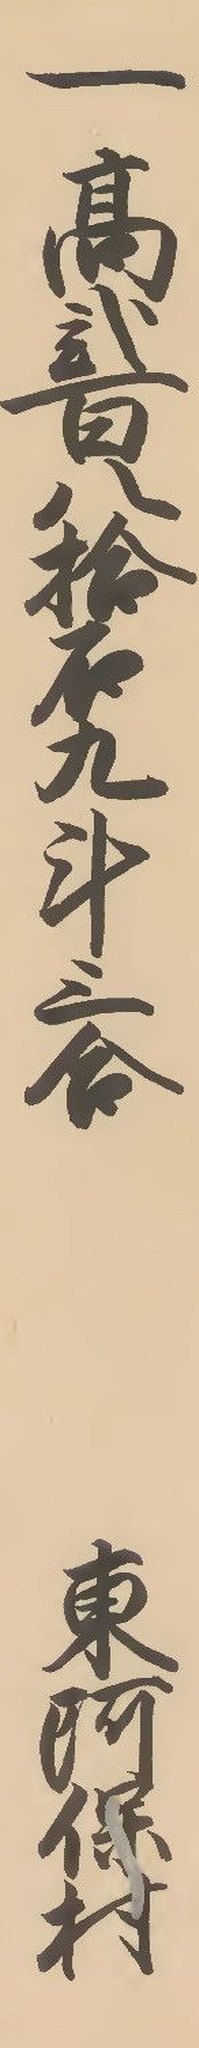一高弐百八拾石九斗三合東阿保村
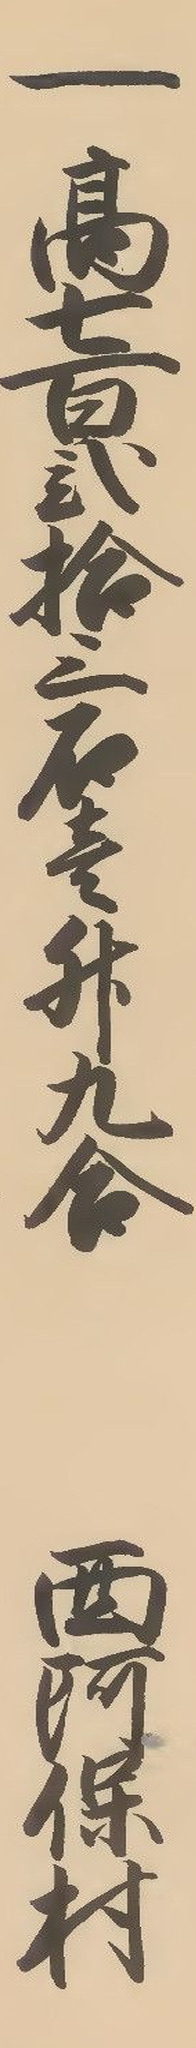一高七百弐拾三石壱升九合西阿保村
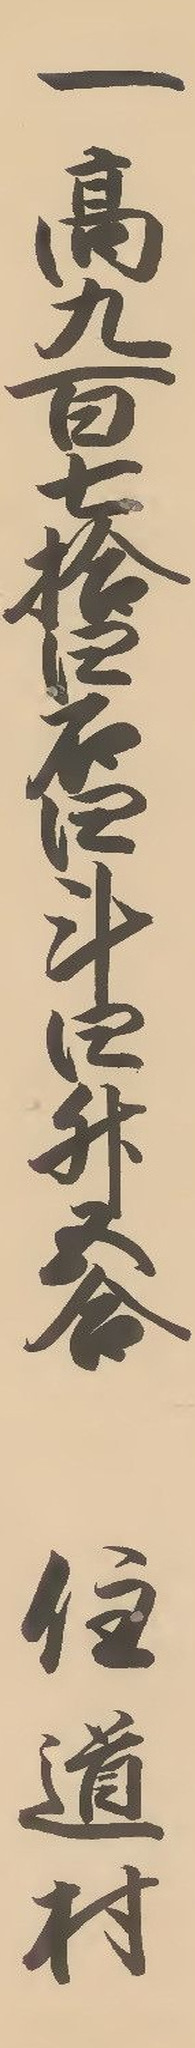一高九百七拾四石四斗四升五合住道村

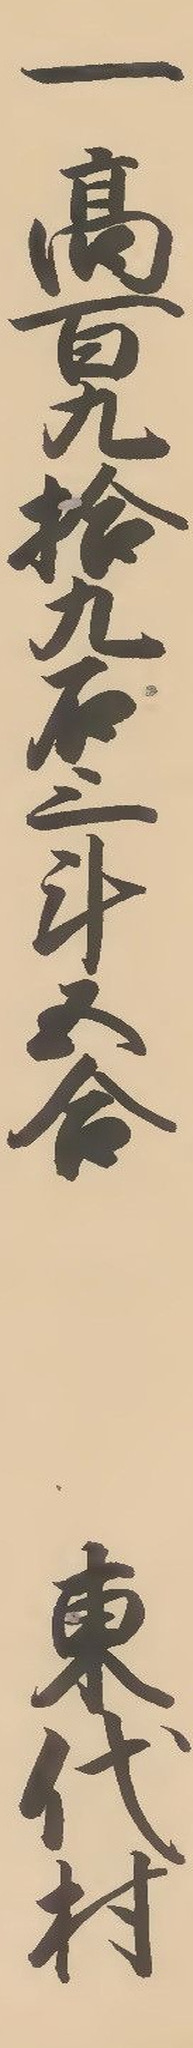一高百九拾九石三斗五合東代村
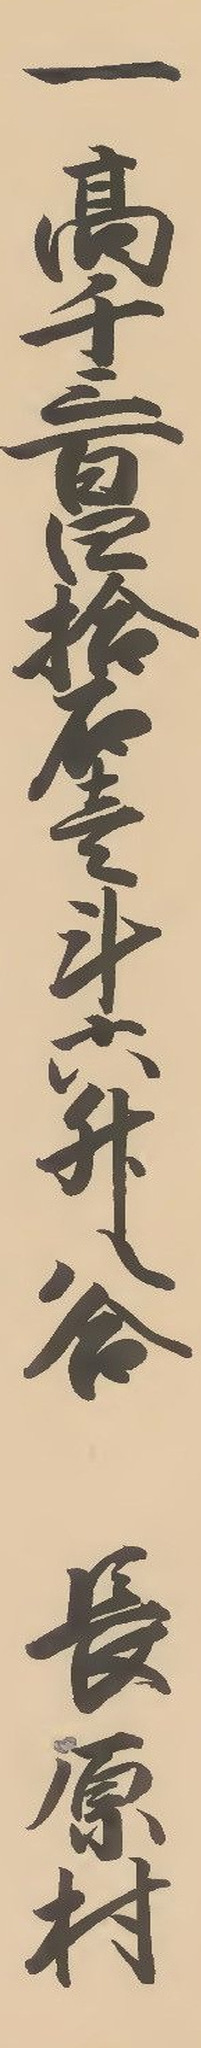一高千三百四拾石壱斗六升八合長原村
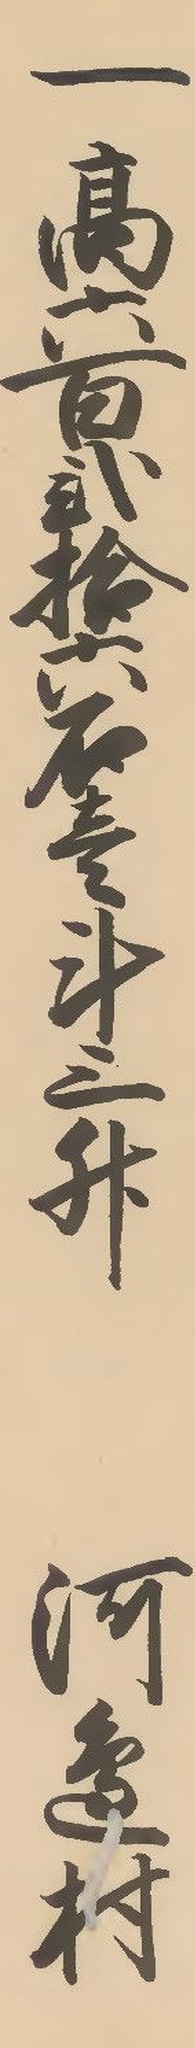一高六百弐拾六石壱斗三升河辺村
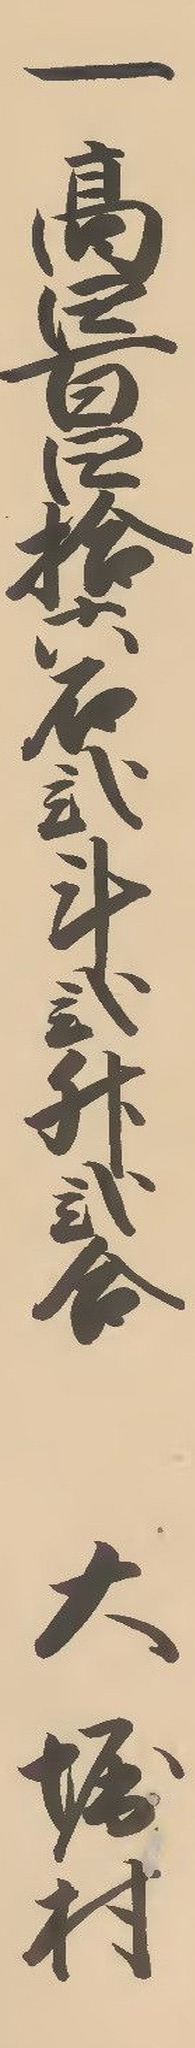一高四百四拾六石弐斗弐升弐合大堀村
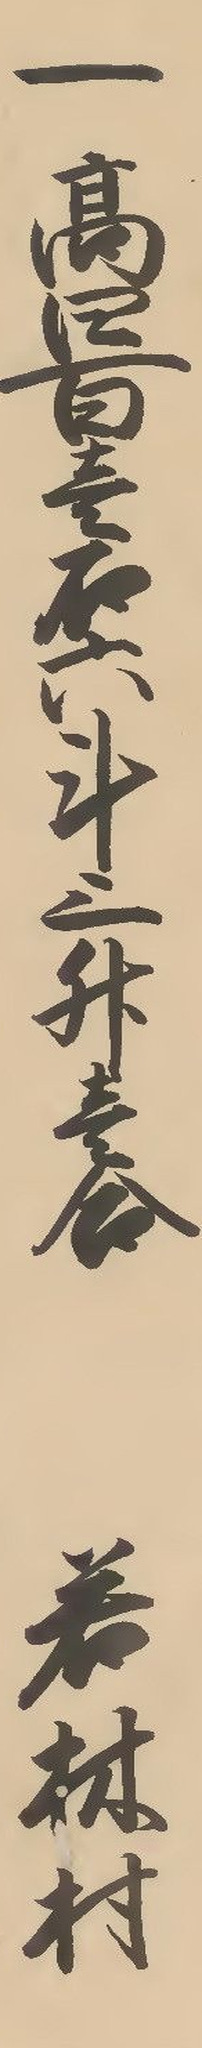一高四百壱石六斗三升壱合若林村
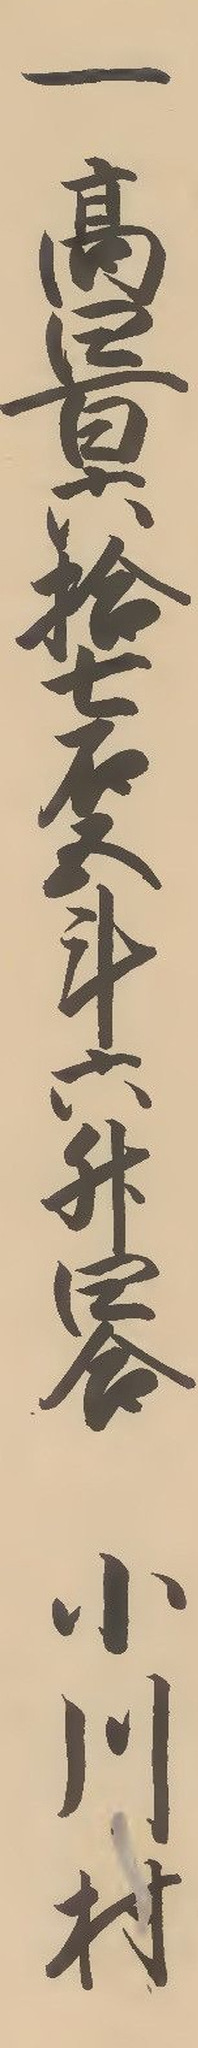一高四百六拾七石五斗六升四合小川村
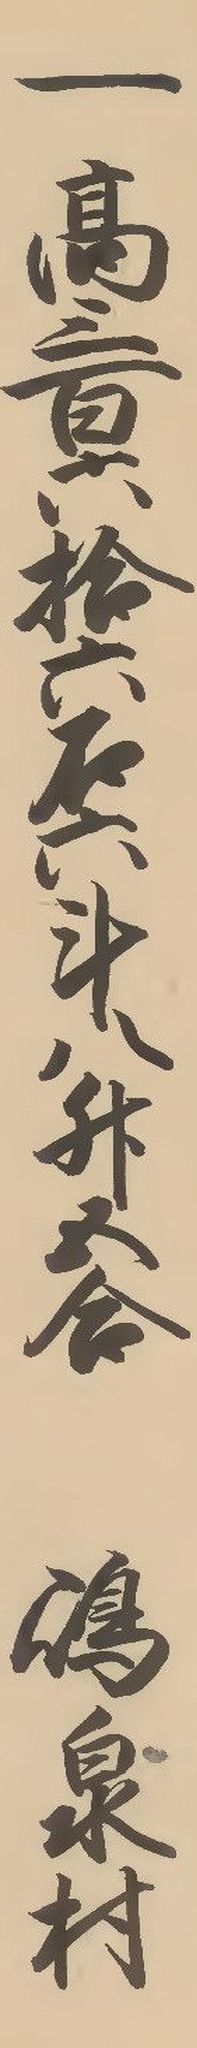一高三百六拾六石六斗八升五合島泉村
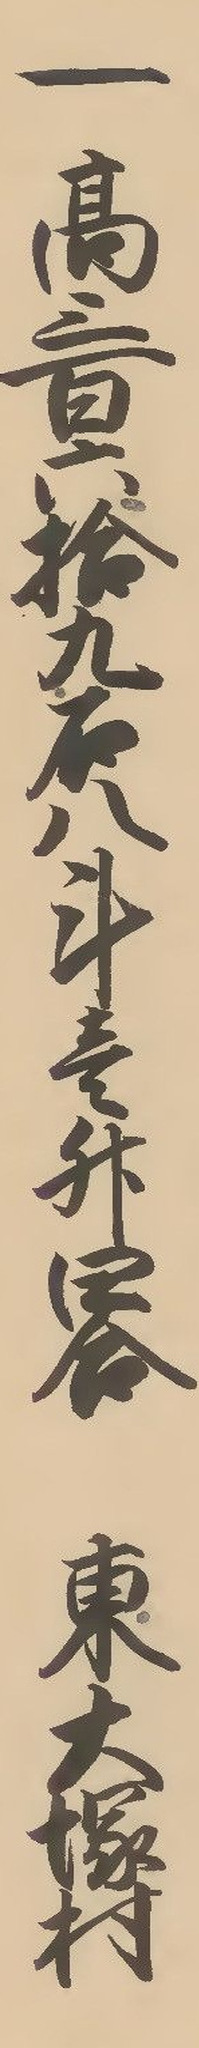一高三百六拾九石八斗壱升四合東大塚村

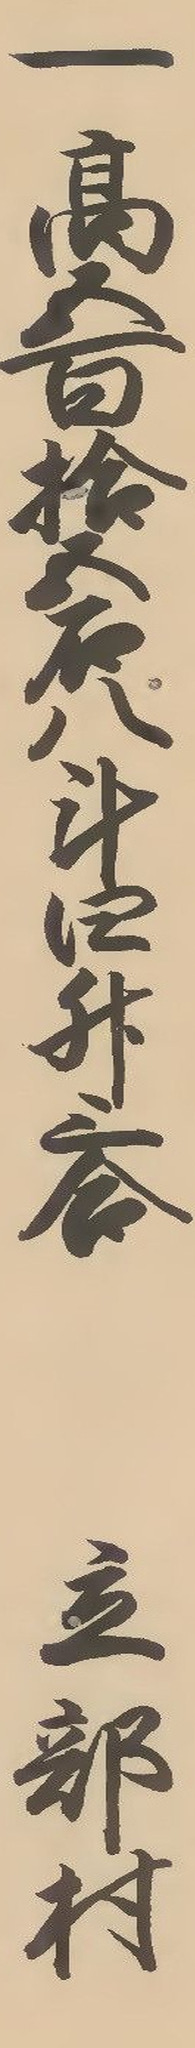一高五百拾五石八斗四升三合立部村
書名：河内国郷帳
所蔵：国立公文書館 National Archives of Japan
